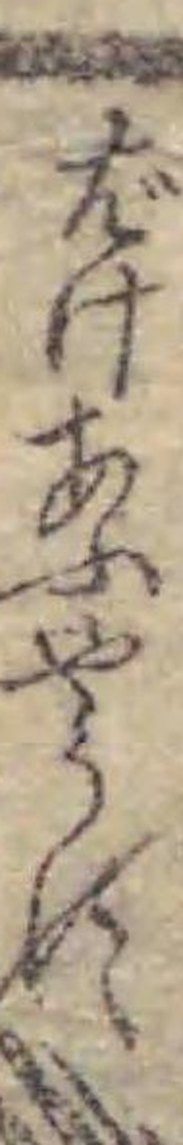ばけあふやうす
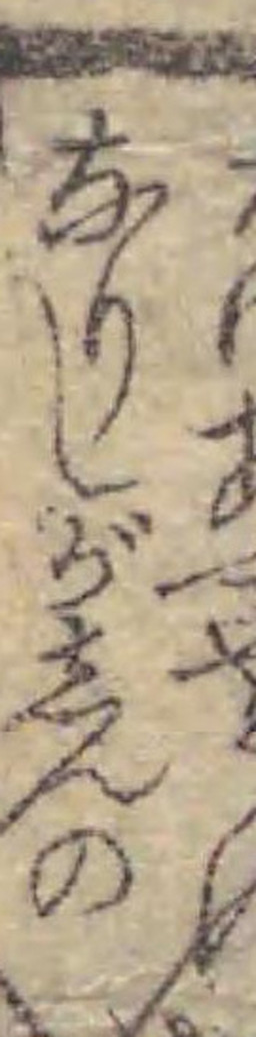なりしがしんの
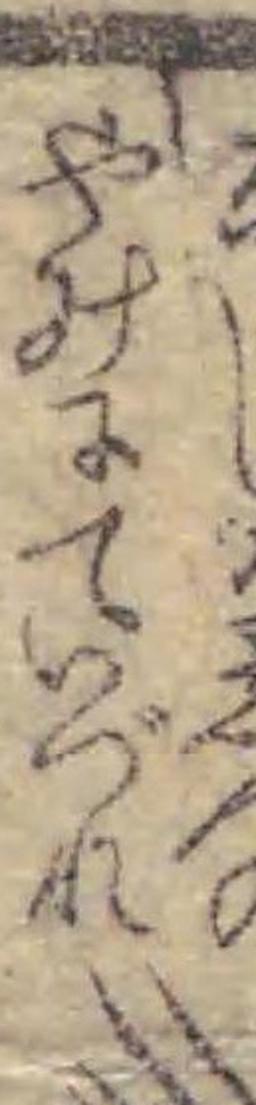やみにていづれ
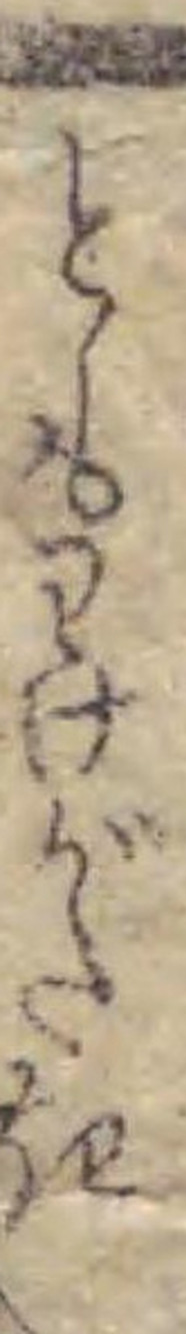ともわけがたき
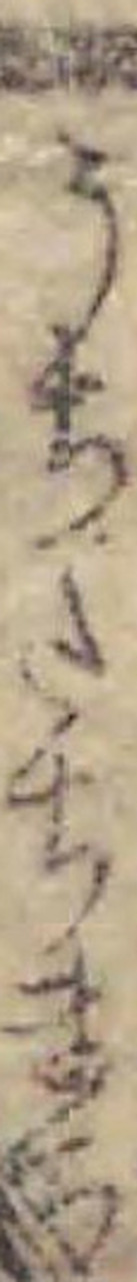うちたちまち
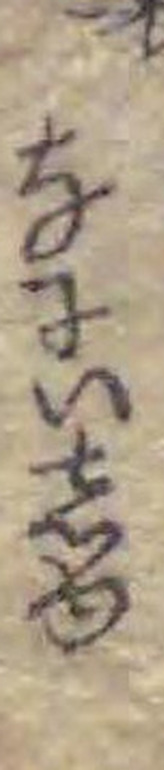なにいしゆ
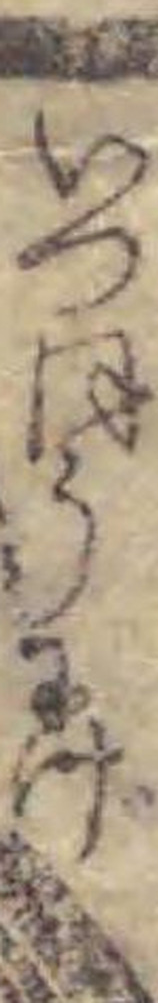いつほうにげ
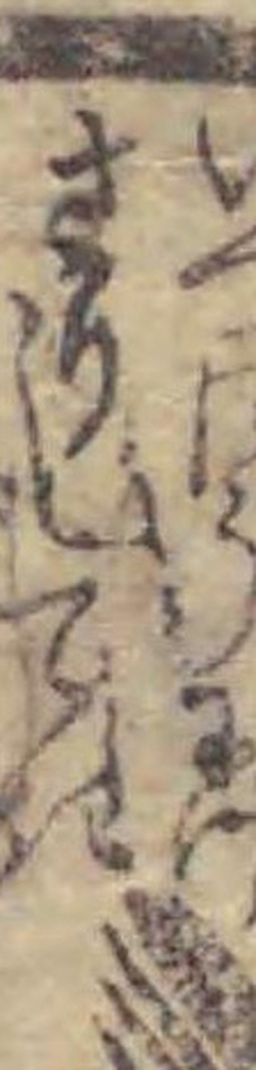さりしてき
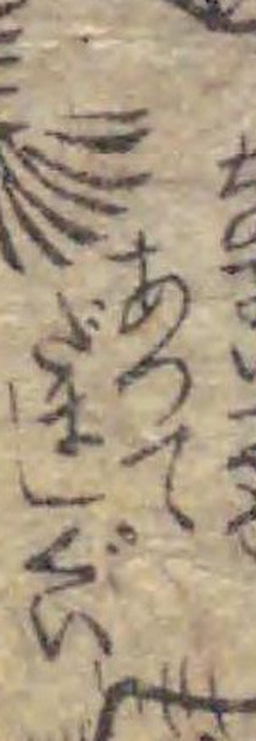だましぐい
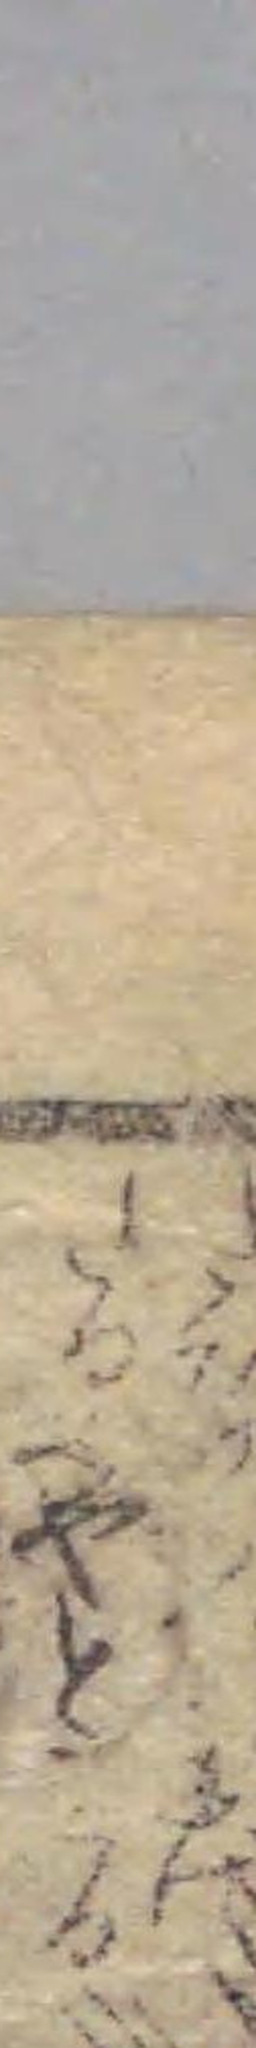たるやとる
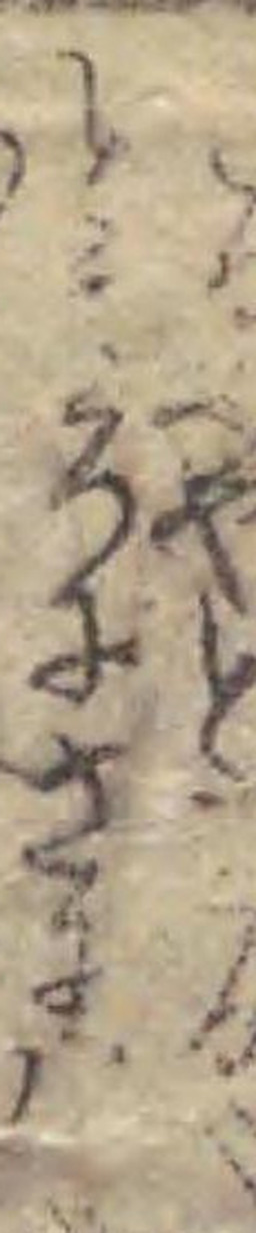ところにさには
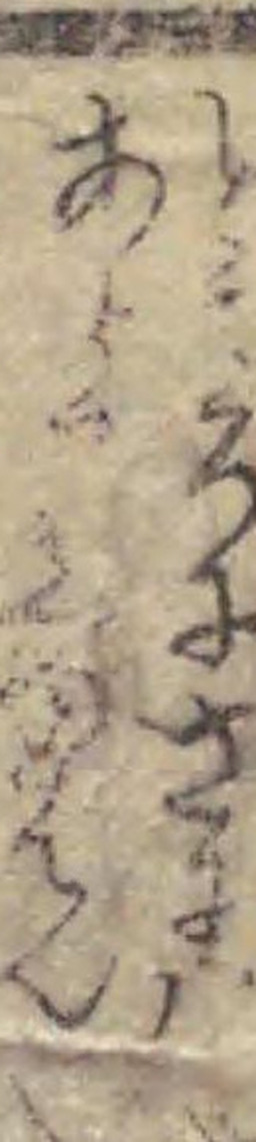あらすしゆはん
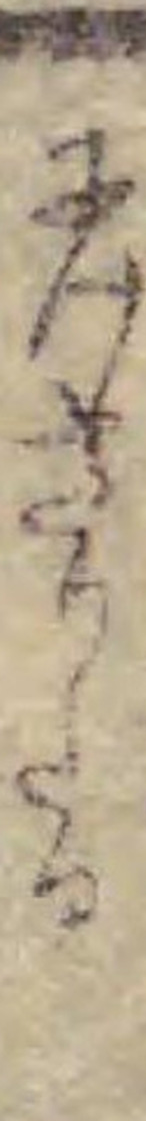にけさりたる
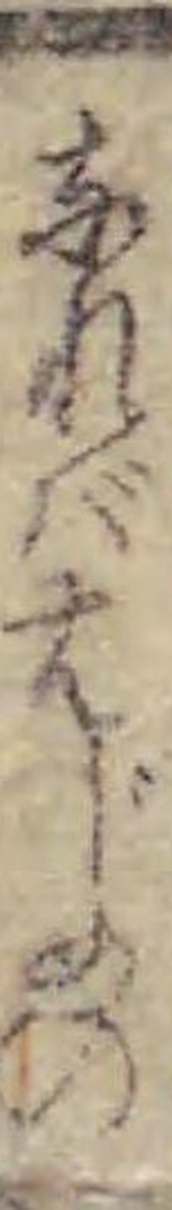なればはじめの
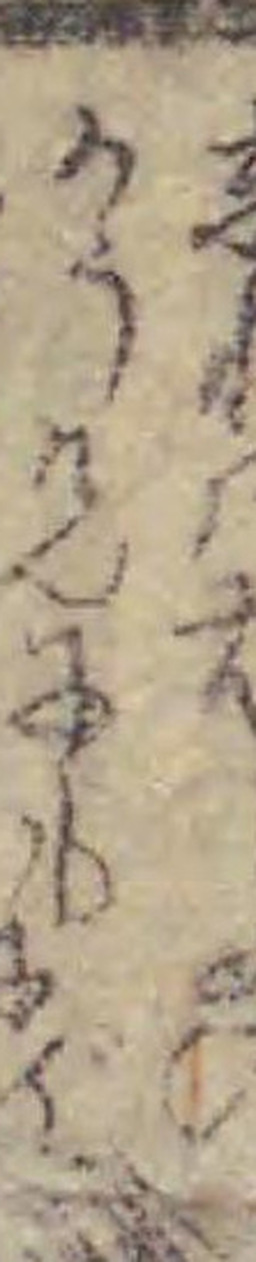かうけんにもにげ
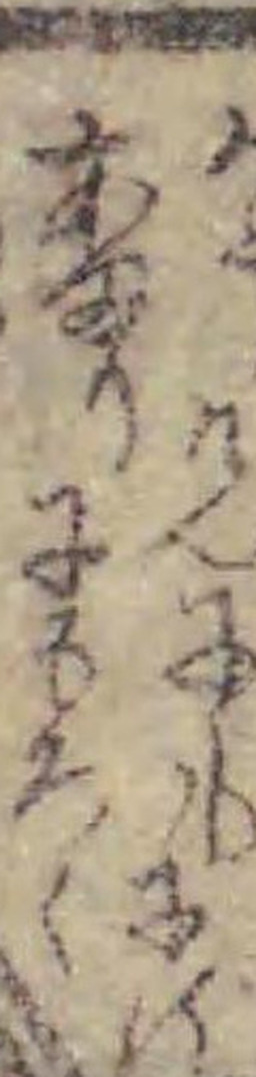あまりにもろく
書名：化物世界夜半嵐 : 3巻
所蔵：国立国会図書館 National Diet Library, JAPAN
